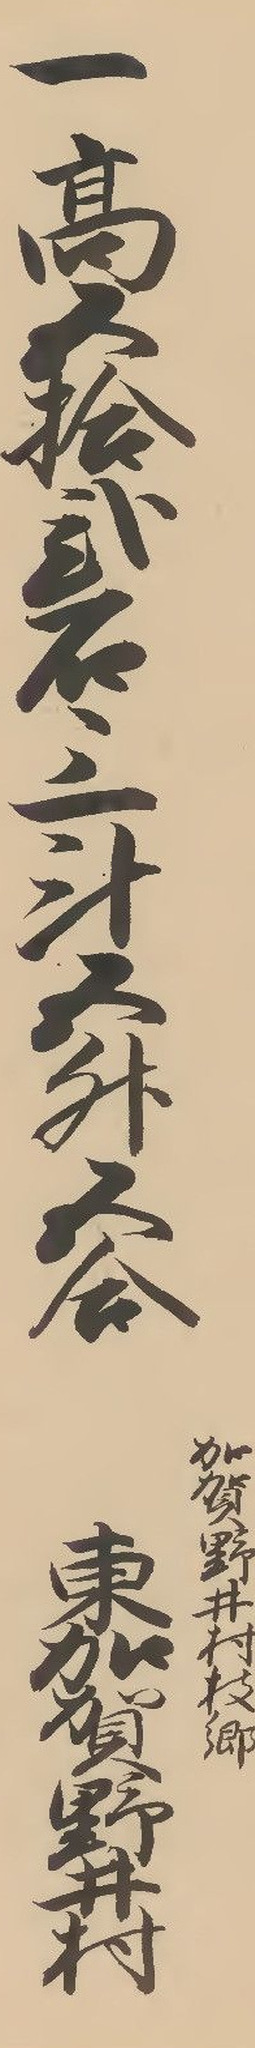一高八拾六石六斗六升壱合加賀野井村

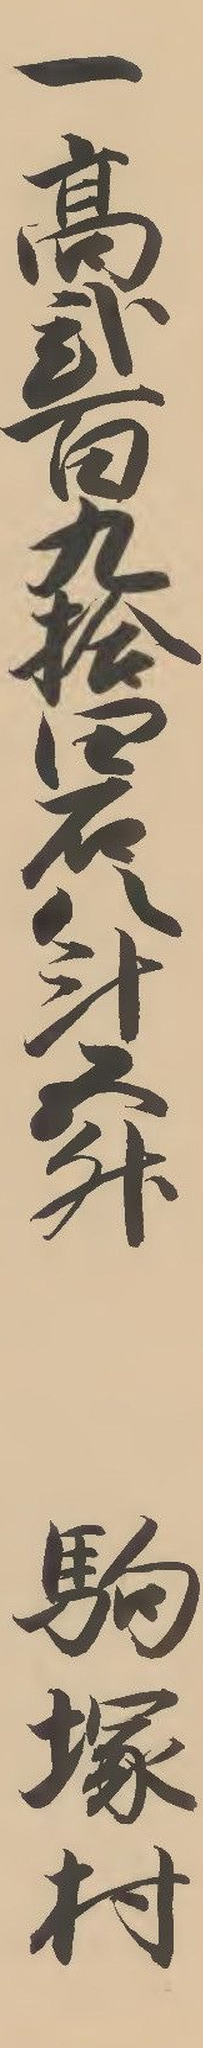一高弐百九拾四石八斗五升駒塚村
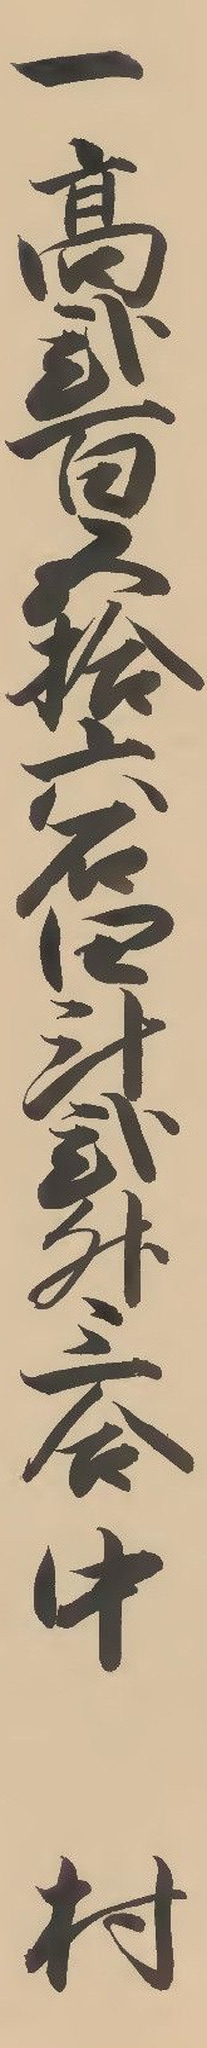一高弐百五拾六石四斗弐升三合中村
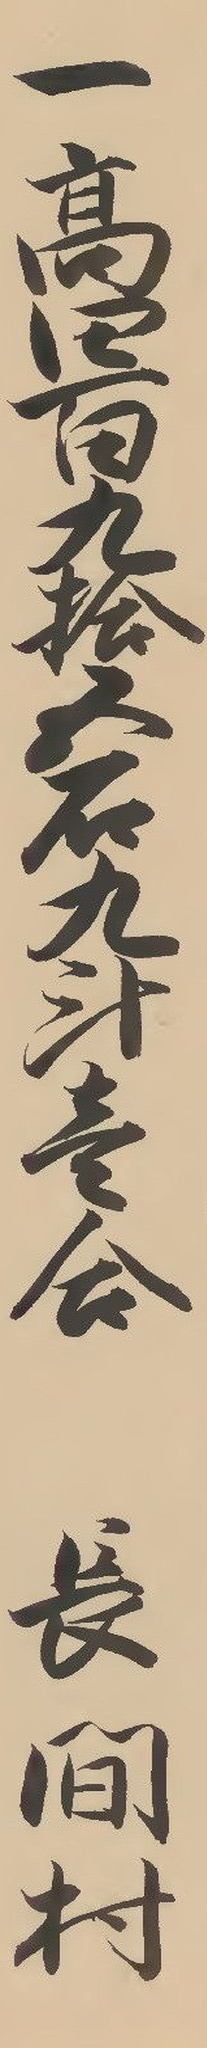一高四百九拾五石九斗壱合長間村
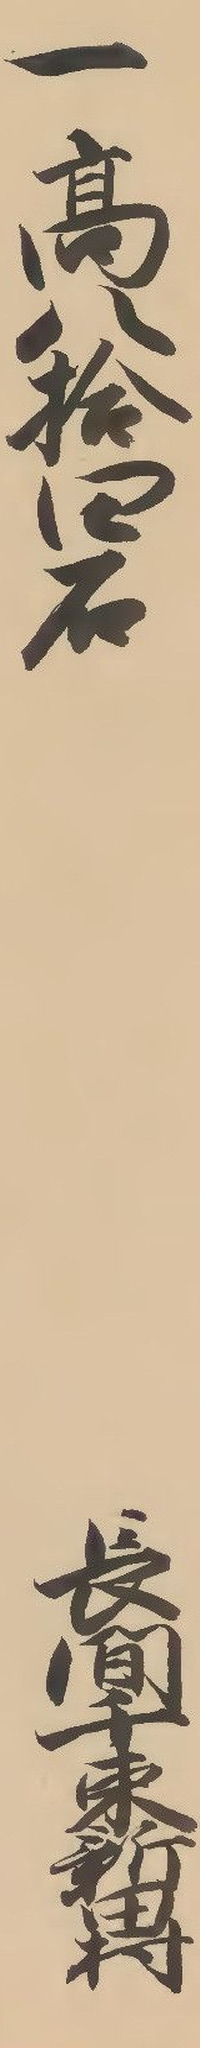一高八拾四石長間千束新田村
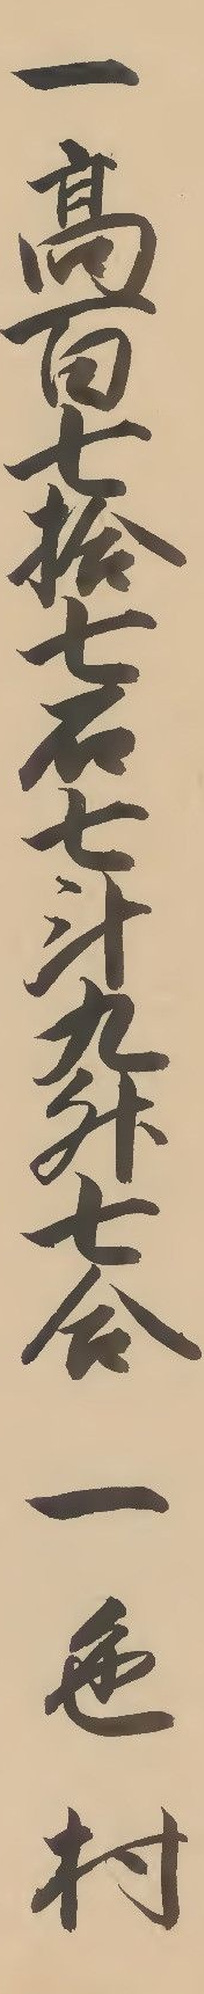一高百七拾七石七斗九升七合一色村
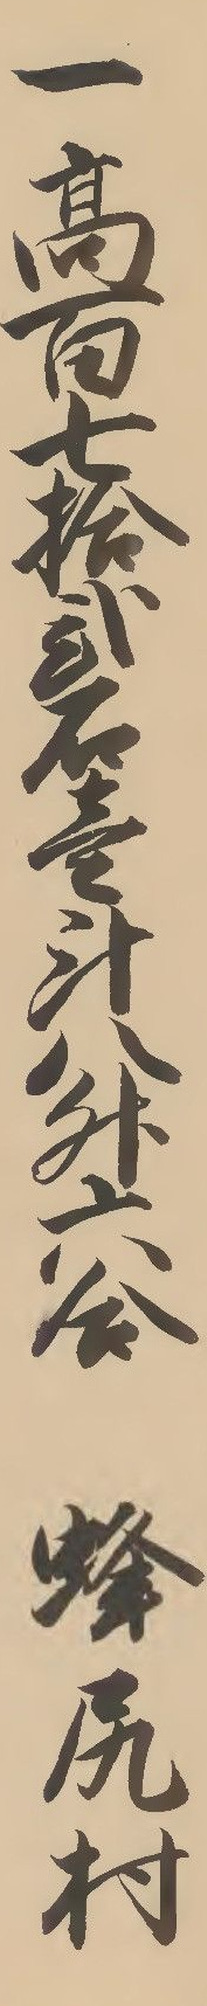一高百七拾弐石壱斗八升六合蜂尻村
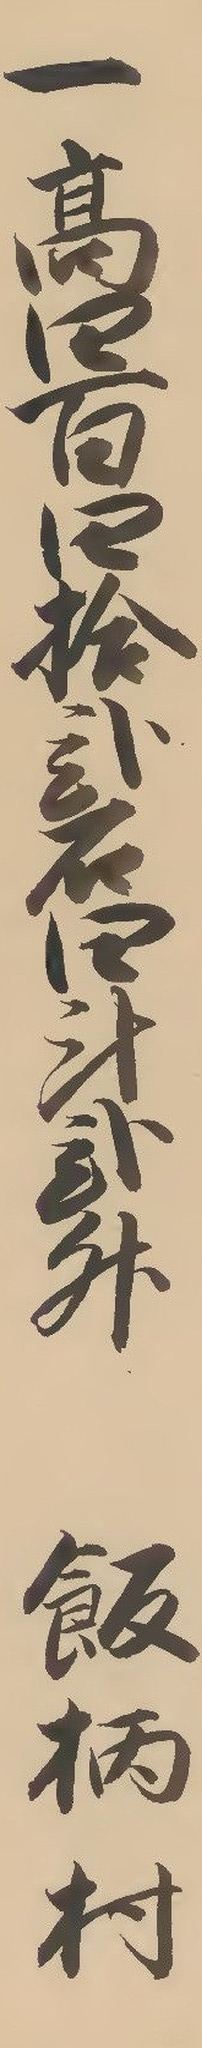一高四百四拾弐石四斗弐升飯柄村

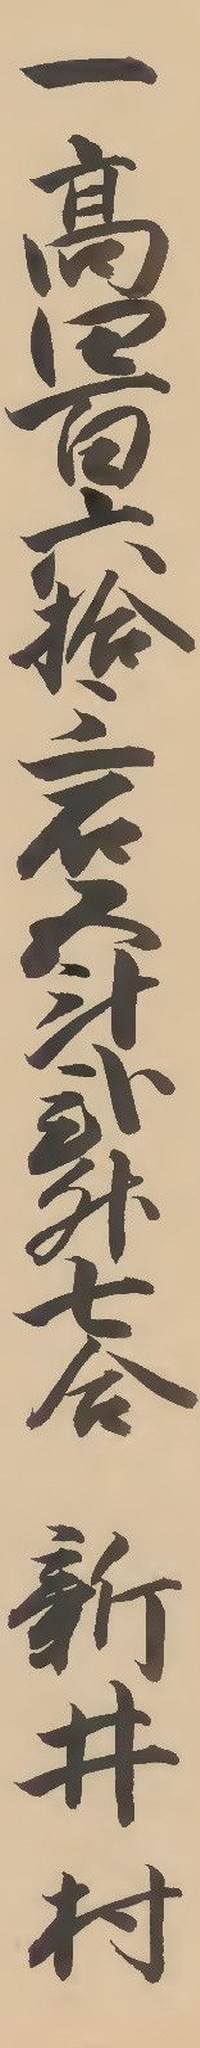一高四百六拾三石五斗弐升七合新井村
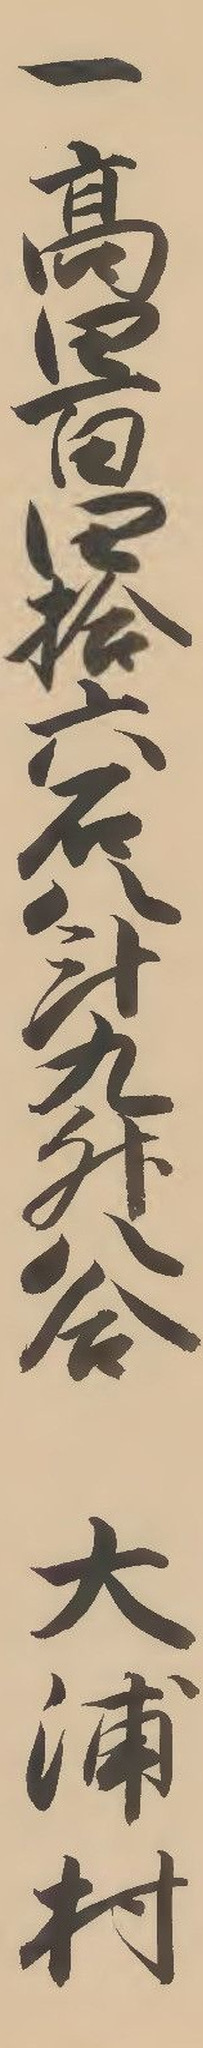一高四百四拾六石八斗九升八合大浦村
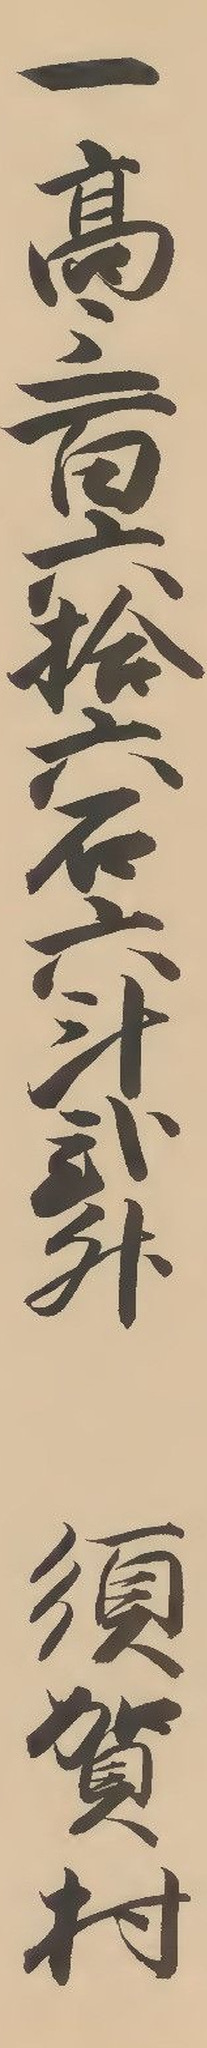一高三百六拾六石六斗弐升須賀村
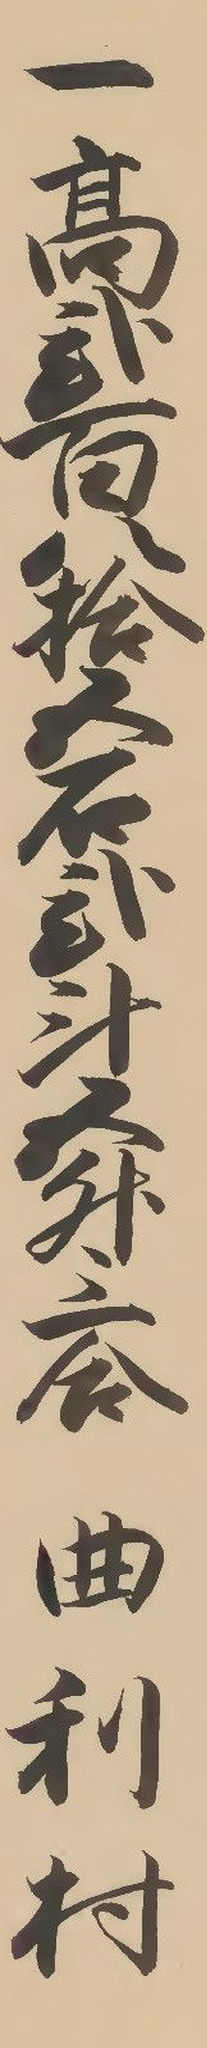一高弐百八拾五石弐斗五升三合曲利村
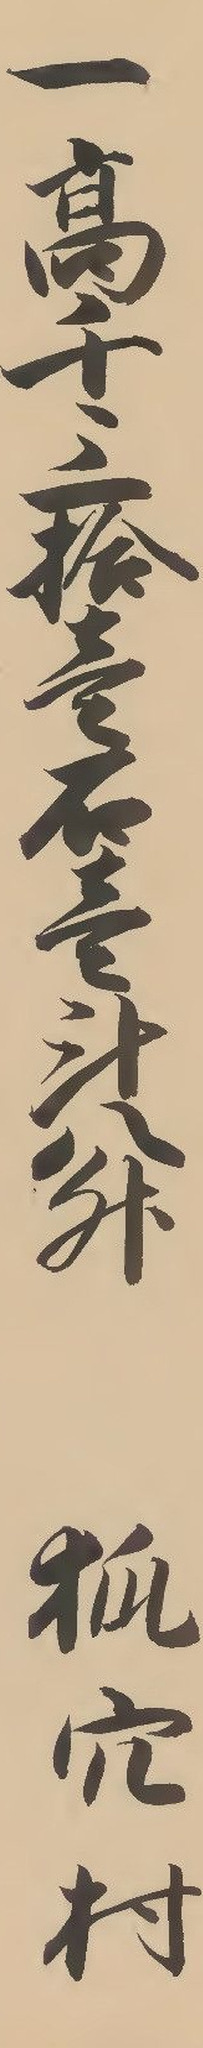一高千三拾壱石壱斗八升狐穴村
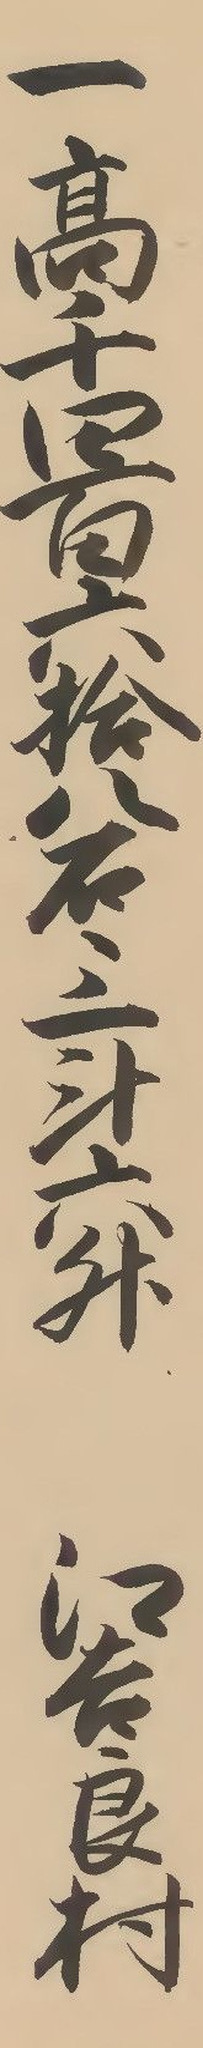一高千四百六拾八石三斗六升江吉良村
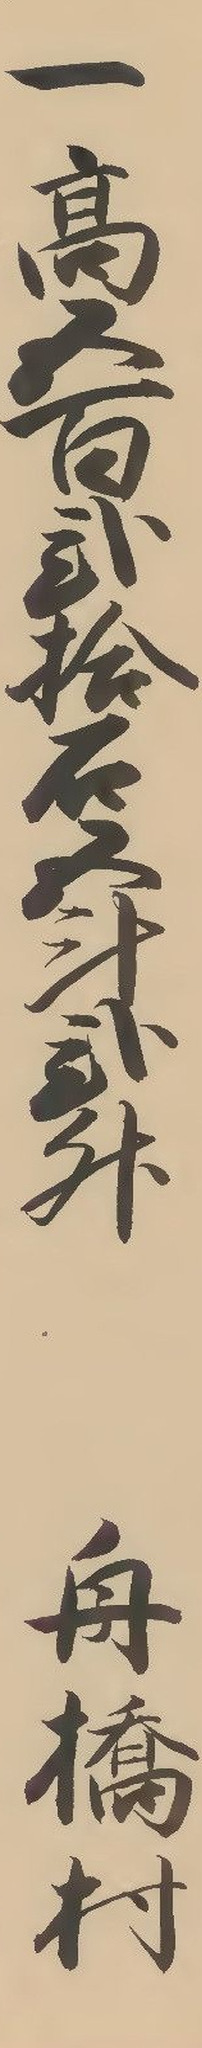一高五百弐拾石五斗弐升舟橋村
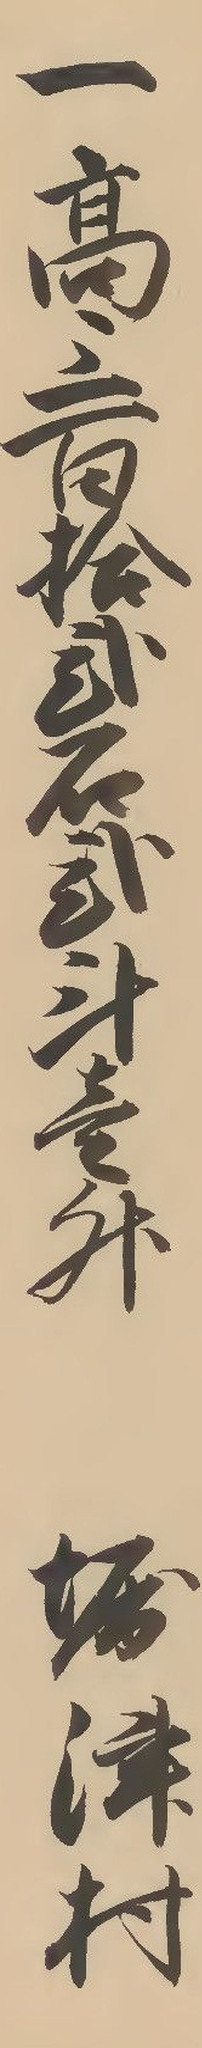一高三百拾弐石弐斗壱升堀津村
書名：美濃国郷帳
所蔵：国立公文書館 National Archives of Japan
